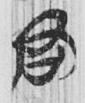君
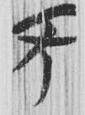不
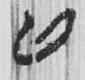㠯（以）
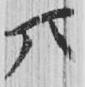亓（其）
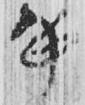身
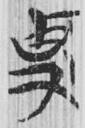○（變）
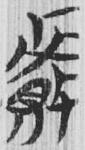{未攴貝}（釐）
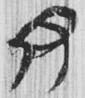尹
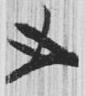之
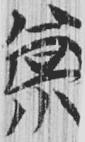○（常）
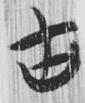古（故）
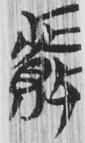{未攴貝}（釐）
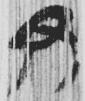君
